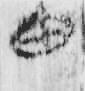甶（思）
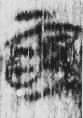聖
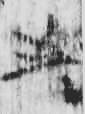之
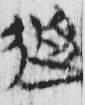逾
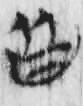皆
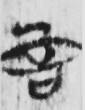言
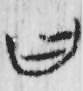曰
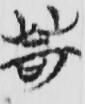苛
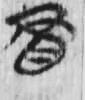冒
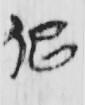○（宣）
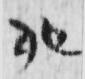卯
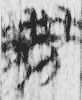㒭
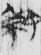殺
